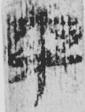柬（簡）
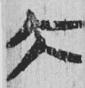大
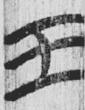王
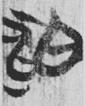泊
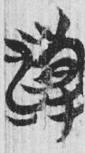○（旱）
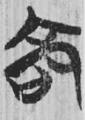命
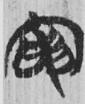龜
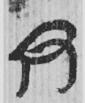尹
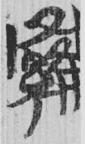羅
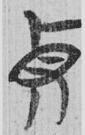真（貞）
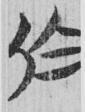於
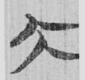大
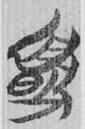○（夏）
